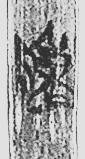陳
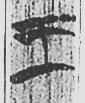王
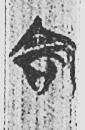命
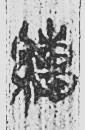{糸東田}
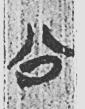公
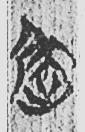屈
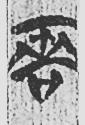{巫口}
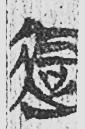{辶石}
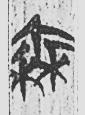秦
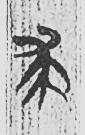求
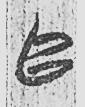𠂤
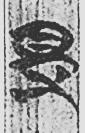𠭁
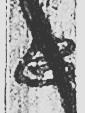𠂤
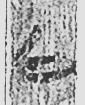㠯（以）
